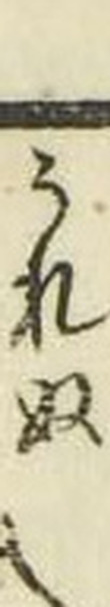うれぬ

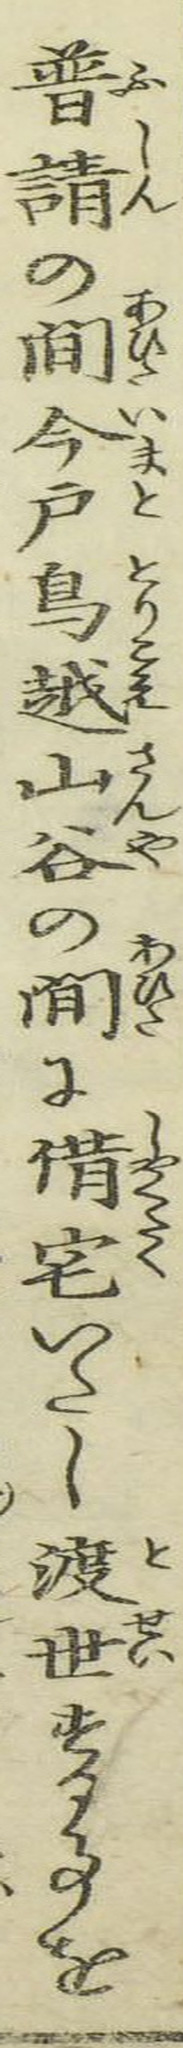普請の間今戸鳥越山谷の間に借宅いたし渡世する事を
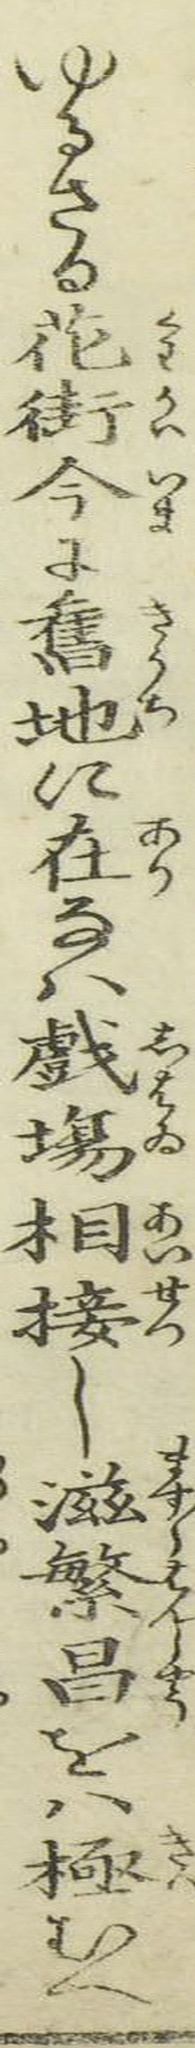ゆるさる花街今に旧地に在なは戯場相接し滋繁昌をは極むへ
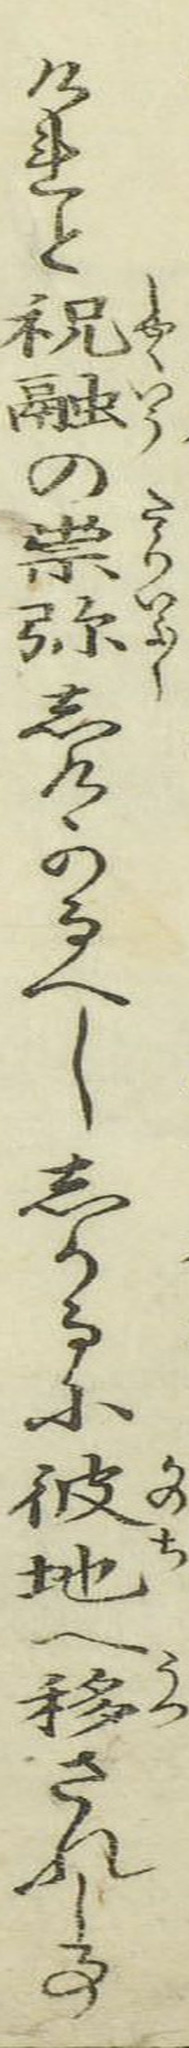けれと祝融の祟弥しけかるへししかるに彼地へ移されし事
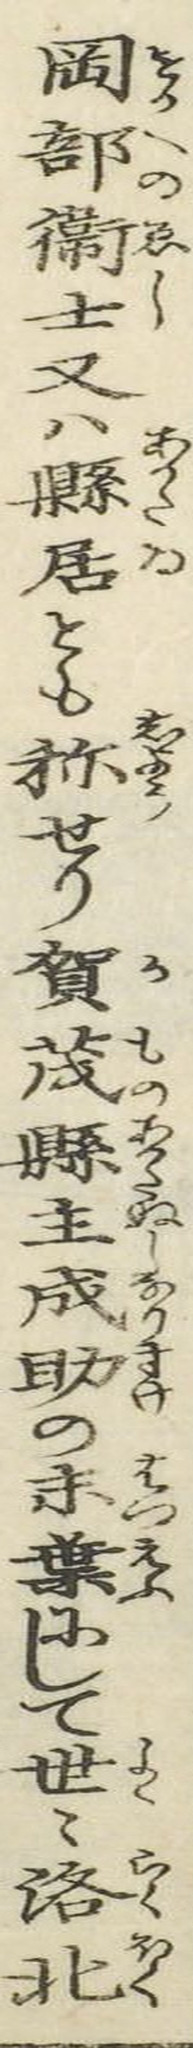岡部衛士又は縣居とも称せり賀茂縣主成助の末葉にして世々洛北
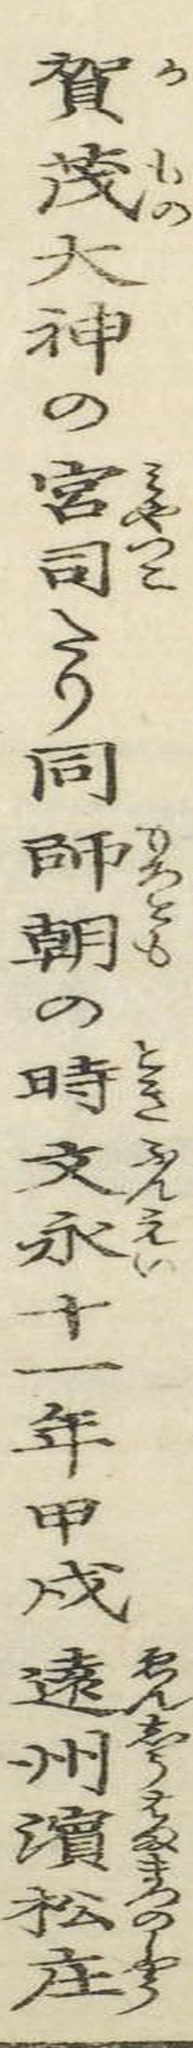賀茂大神の宮司たり同師朝の時文永十一年甲戌遠州濱松庄
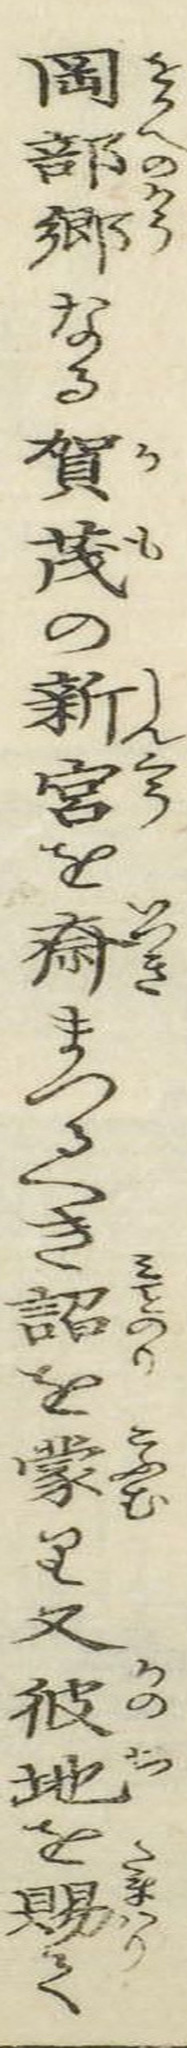岡部郷なる賀茂の新宮を斎まつるへき詔を蒙り又彼地を賜て
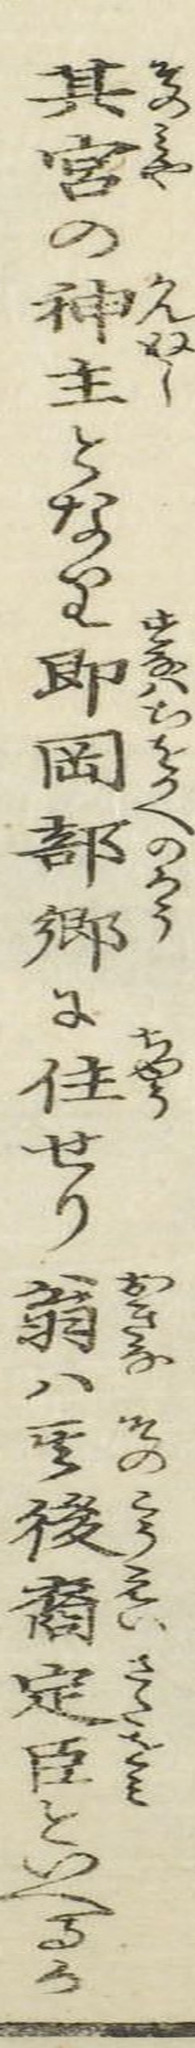其宮の神主となり即岡部郷に住せり翁は其後裔定臣といへるか
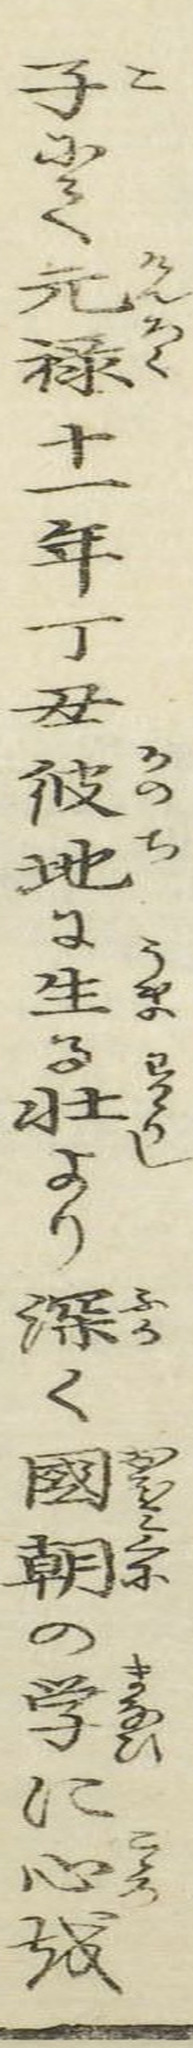子にて元禄十一年丁丑彼地に生る壮より深く國朝の学に心を
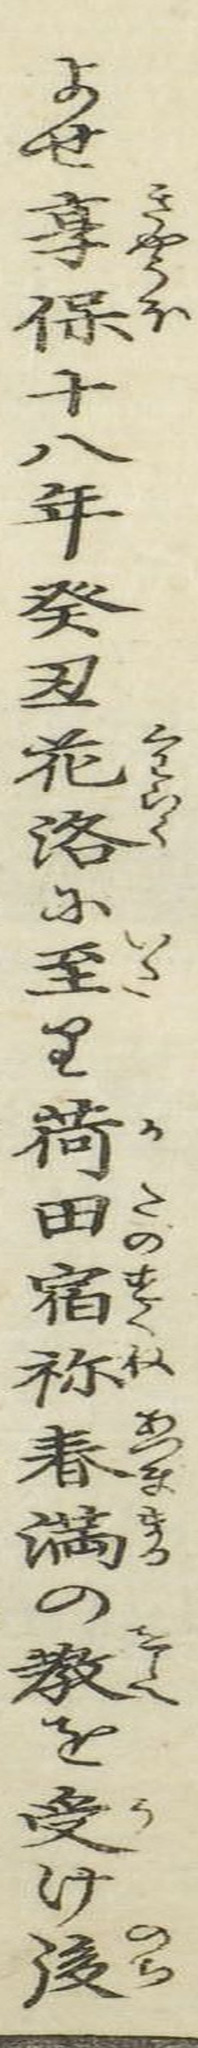よせ享保十八年癸丑花洛に至り荷田宿祢春満の教を受け後
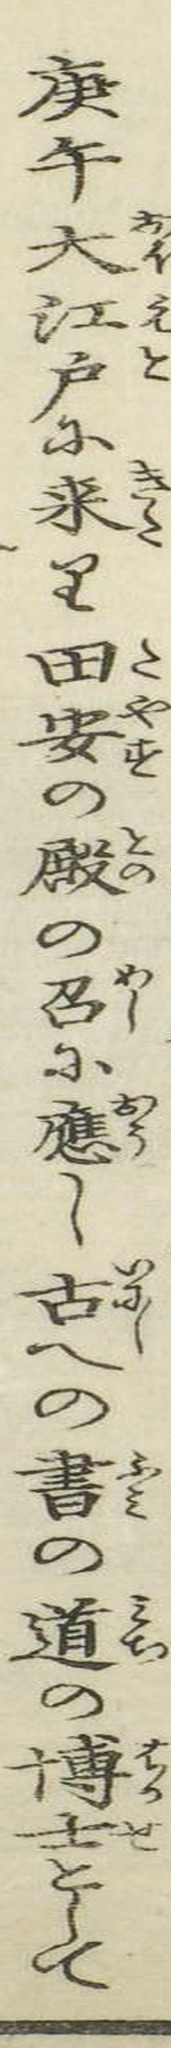庚午大江戸に来り田安の殿の召に応し古への書の道の博士として
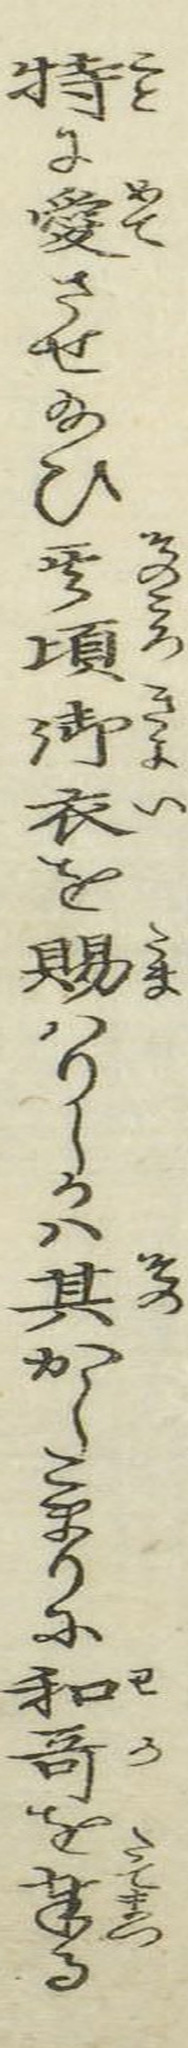特に愛させ給ひ其頃御衣を賜はりしかは其かしこまりに和哥を奉る
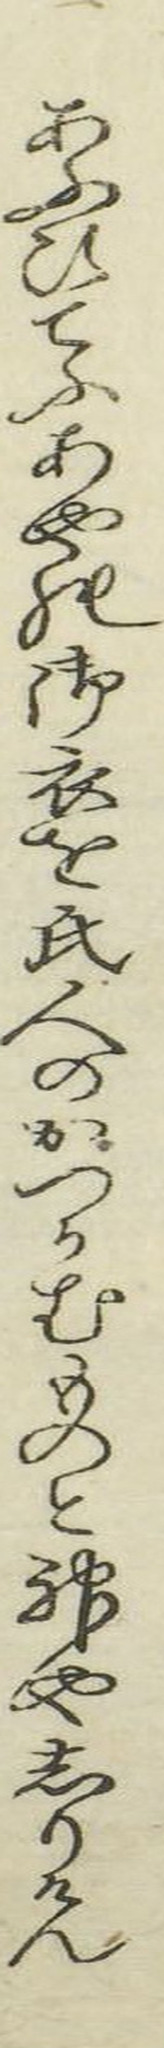あふひてふあやの御衣を氏人のかつかむものと神やしりけん
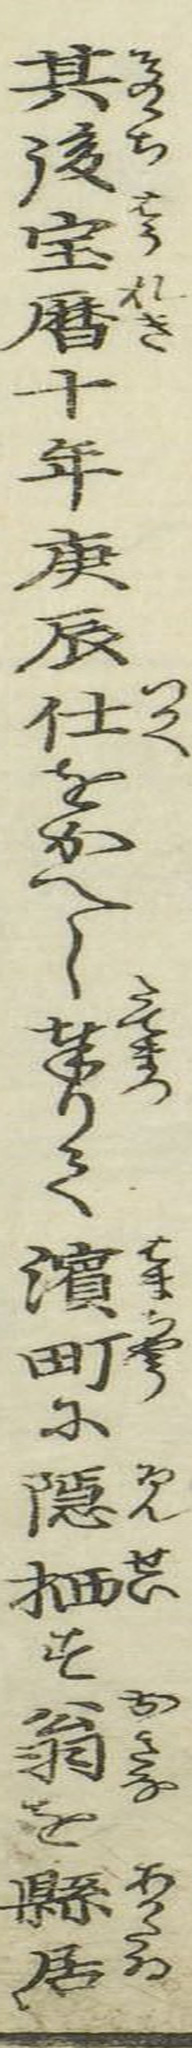其後宝暦十年庚辰仕をかへし奉りて濱町に隠栖す翁を縣居
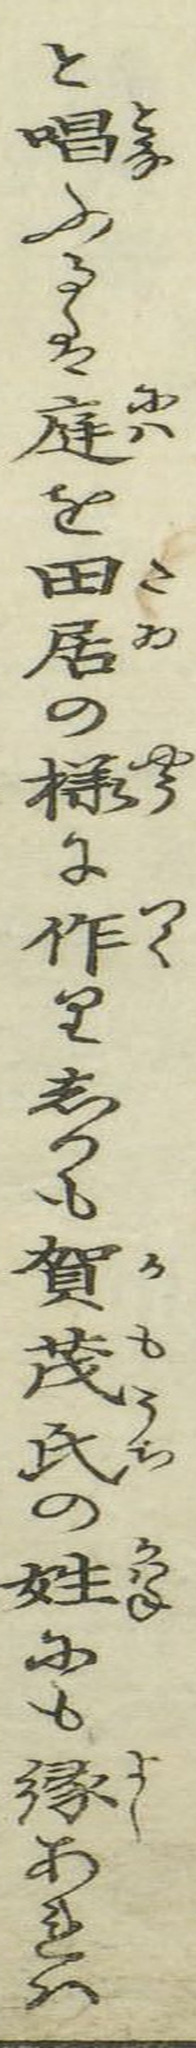と唱ふるは庭を田居の様に作りしかも賀茂氏の姓にも縁あれは
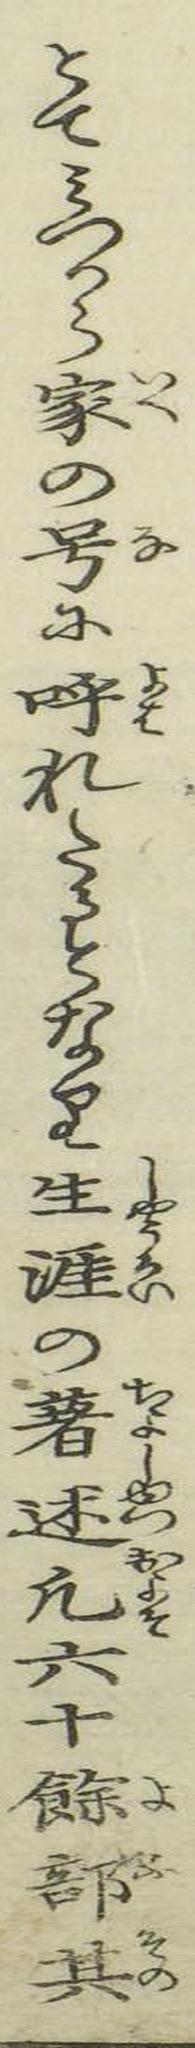とてみつから家の号に呼れたるとなり生涯の著述凡六十餘部其
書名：江戸名所図会 20巻 巻之2
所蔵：東京学芸大学教育コンテンツアーカイブ
